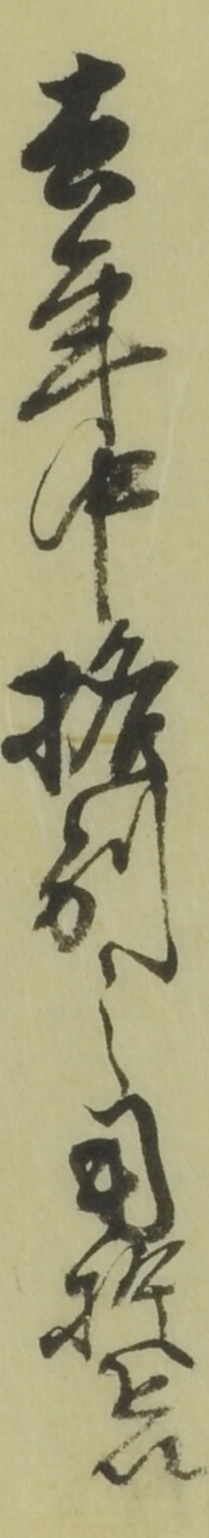去年中格別之用捨を以
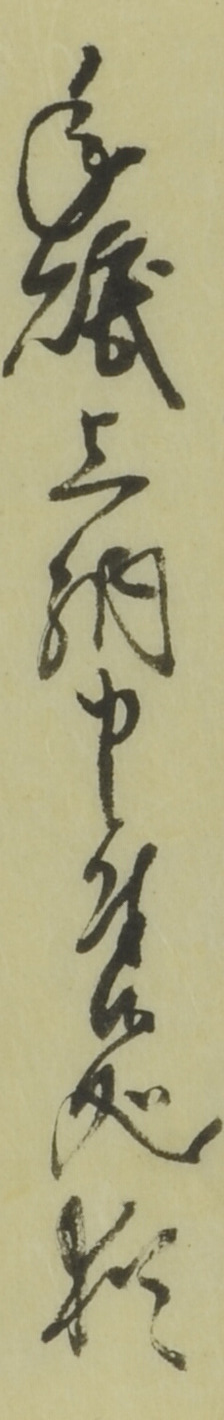年賦上納申付候処猶
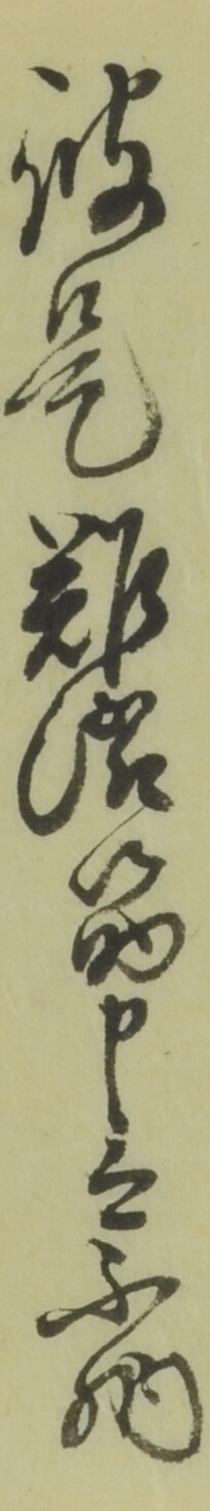彼是難渋筋申立不納
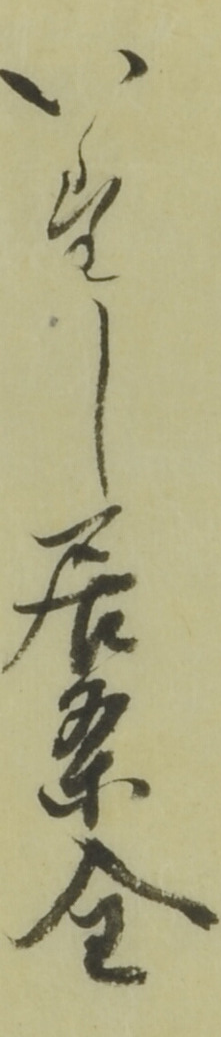いたし居条全

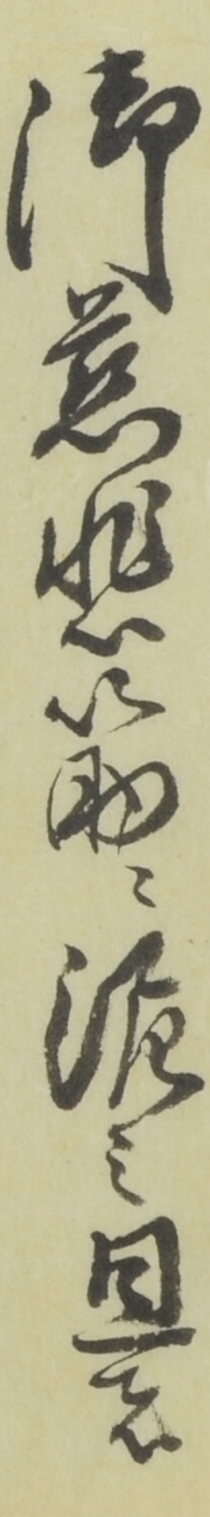御慈悲筋ニ泥ミ且は
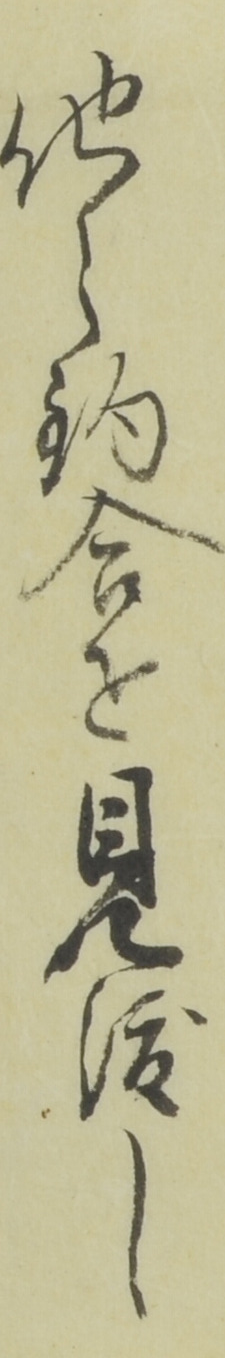他之釣合を見渡し
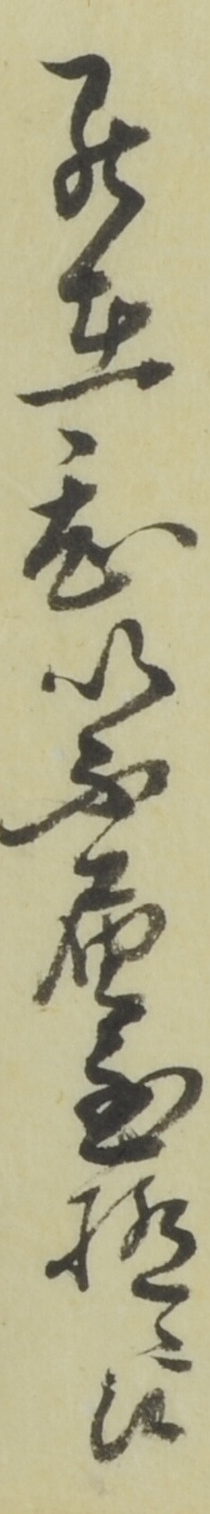罷在甚以不届至極ニ候
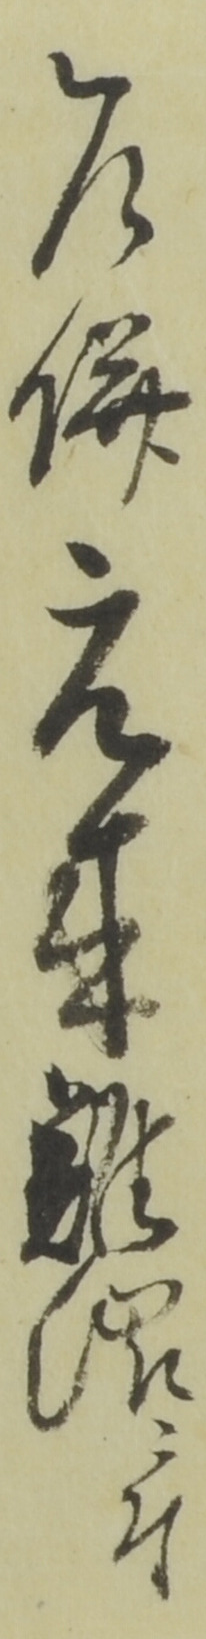乍併元来難渋ニ付
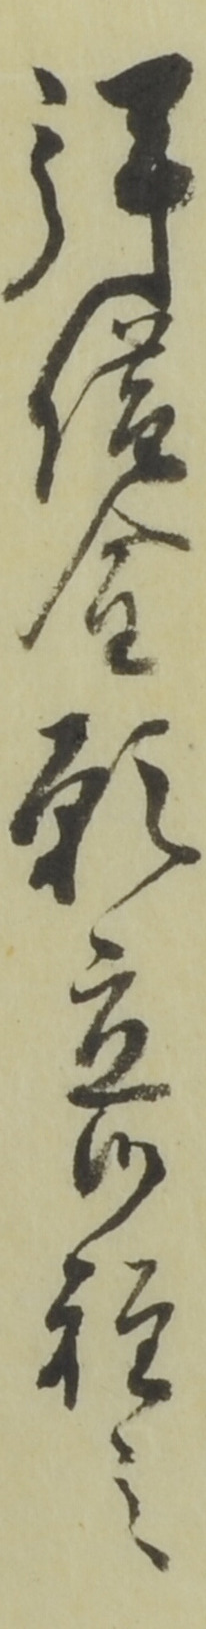拝借金願立候程之
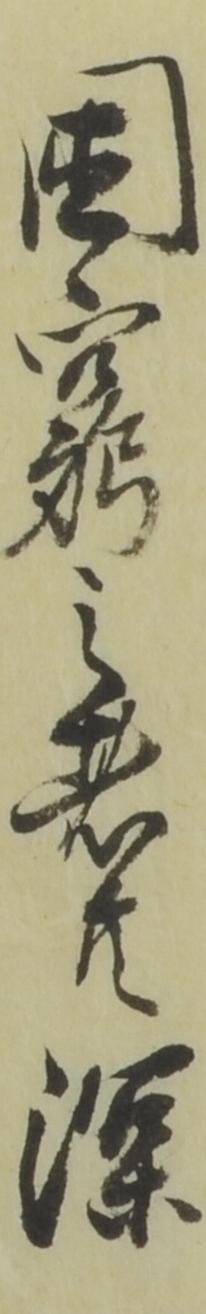困窮之者共深
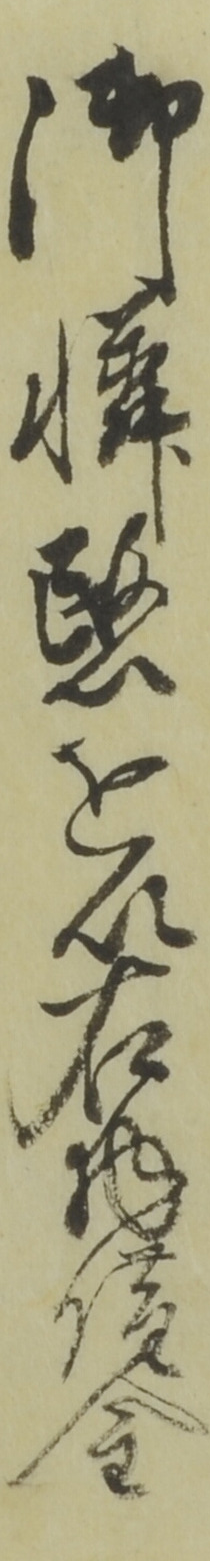御憐愍を以右拝借金
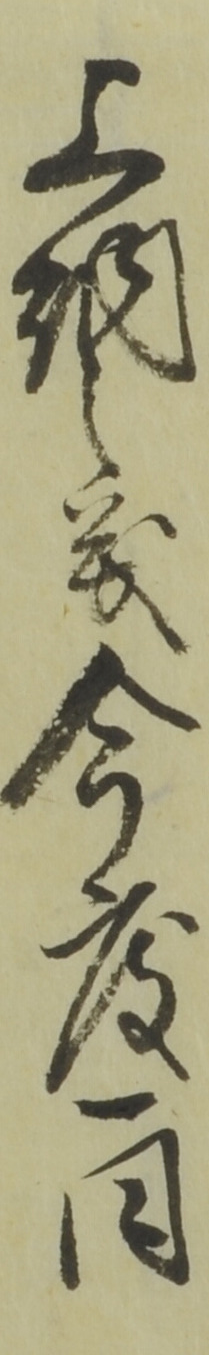上納之義今度一同
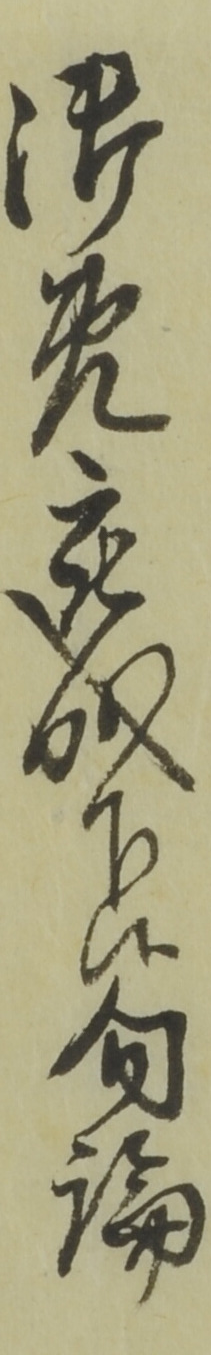御免被成下候勿論
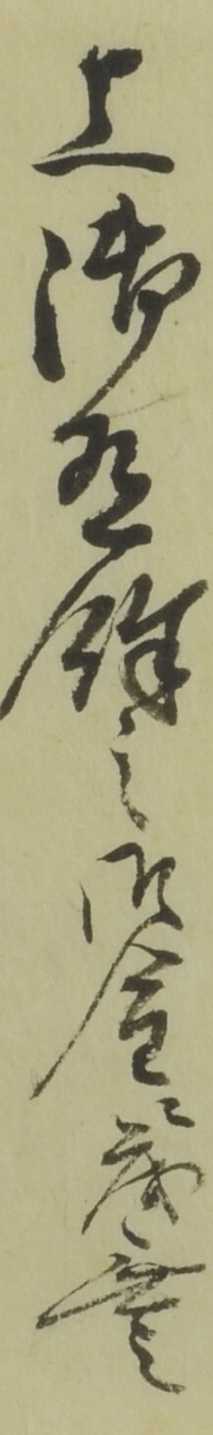上御有余之御金ニも無之
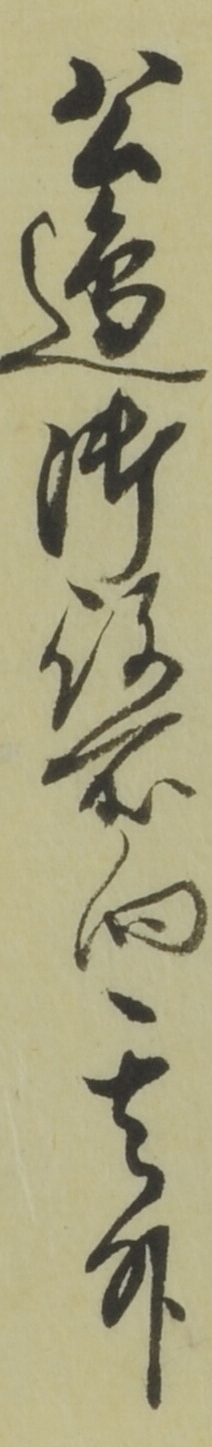公辺御役所向其外
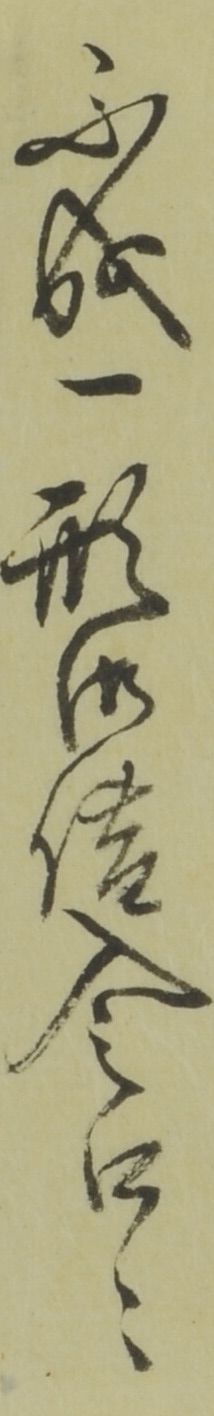不成一形御借入之口々
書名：御触書御書附控
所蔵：伊那市立高遠町図書館・合同会社AMANE
